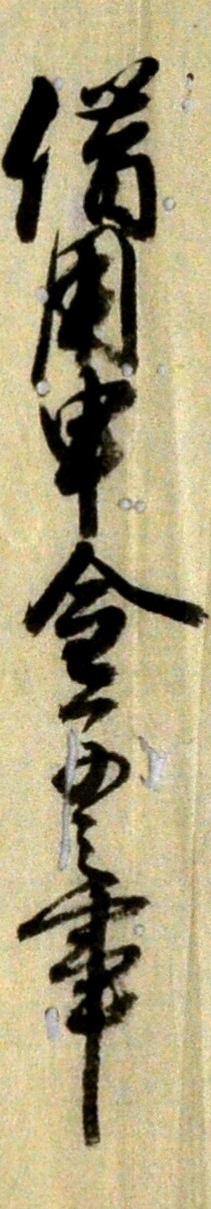借用申金子之事
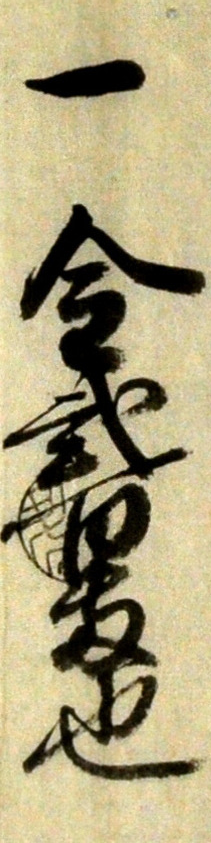一金弐百両也
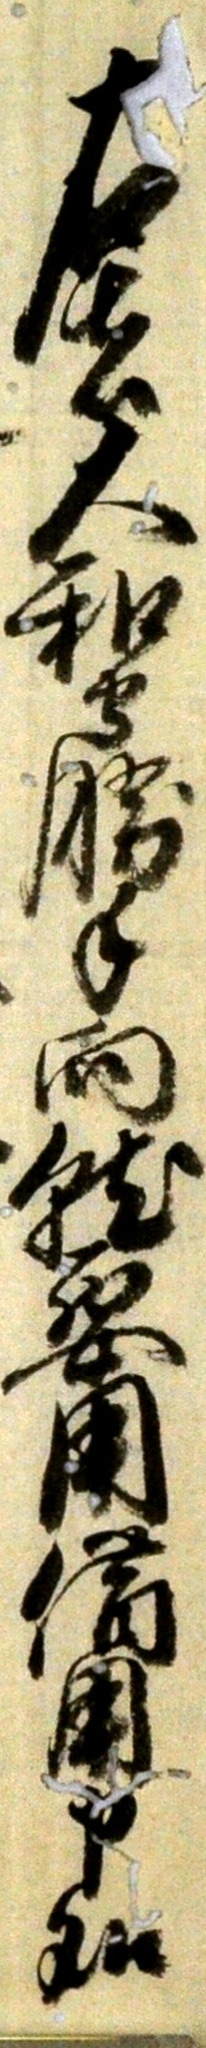右者大和守勝手向就要用借用申処
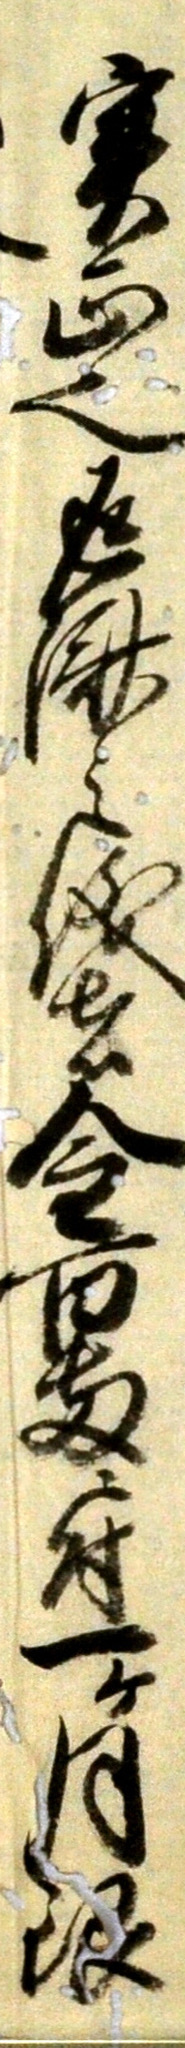実正也返済之儀者金百両ニ付一ヶ月銀
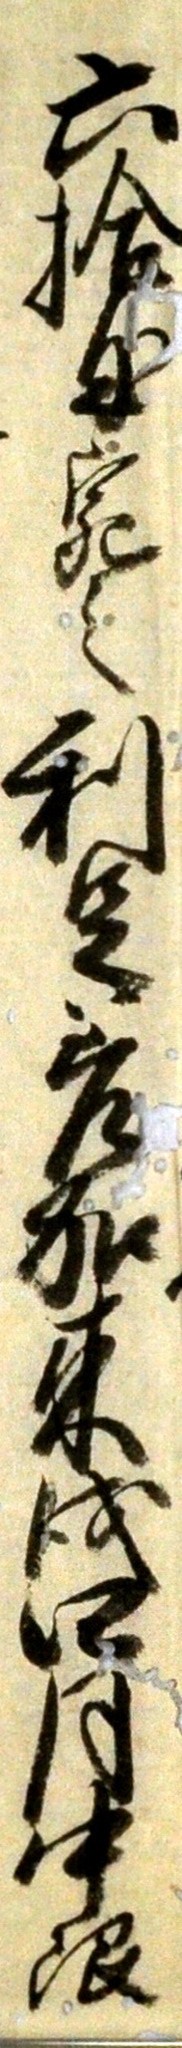六拾匁宛之利足差加来戌四月中限
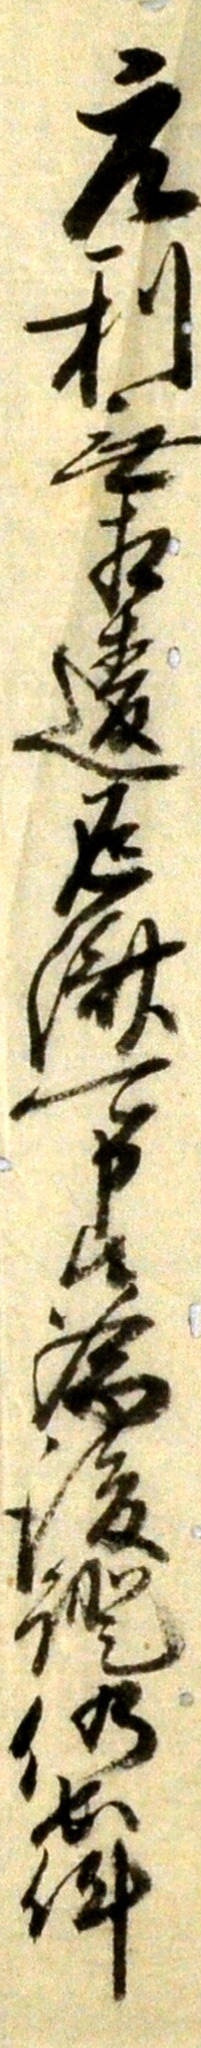元利無相違返済可申候為後証仍如件
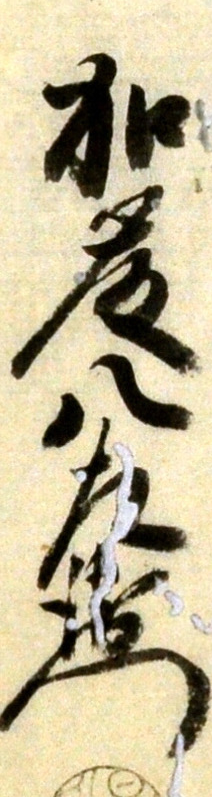加藤八左衛門㊞
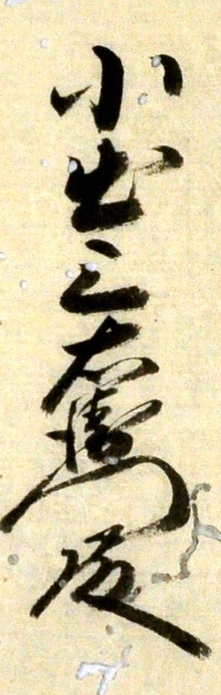小出三右衛門殿
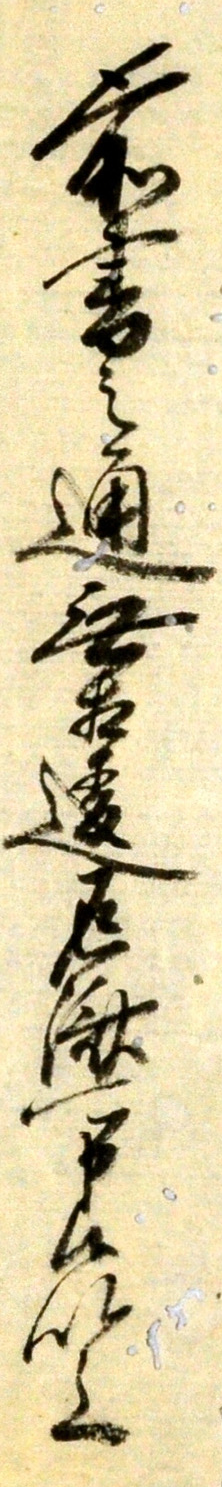前書之通無相違返済可申候以上
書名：借用申金子之事
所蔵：伊那市立高遠町図書館・合同会社AMANE
